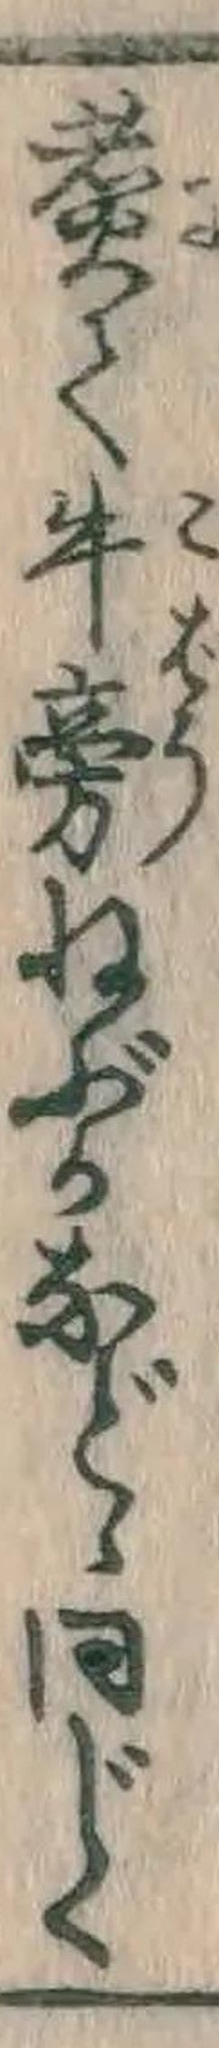煮て牛蒡ねぶかなどゝ同じく
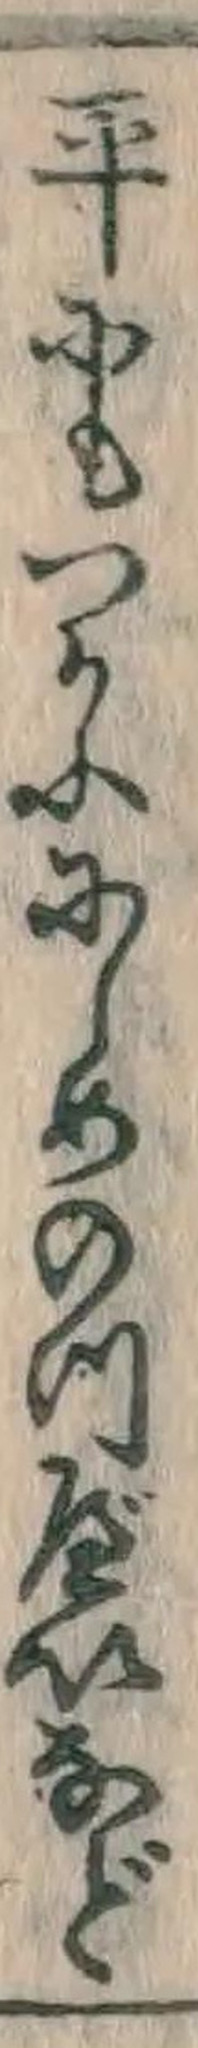平にもつかふにしめのつべいなど
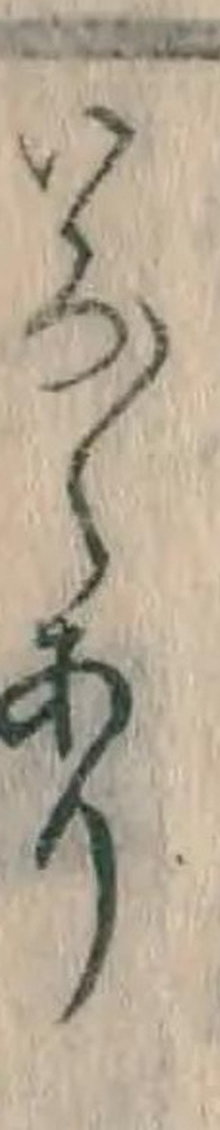いろ〳〵あり
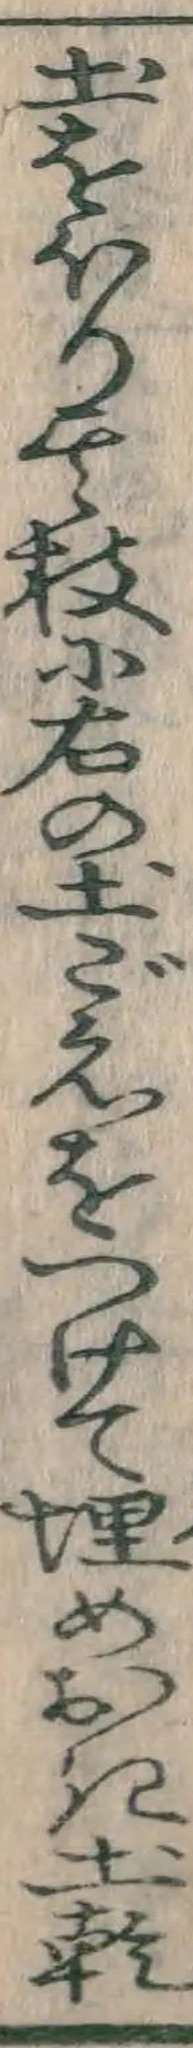土をほり其枝に右の土ごえをつけて埋めおき土乾
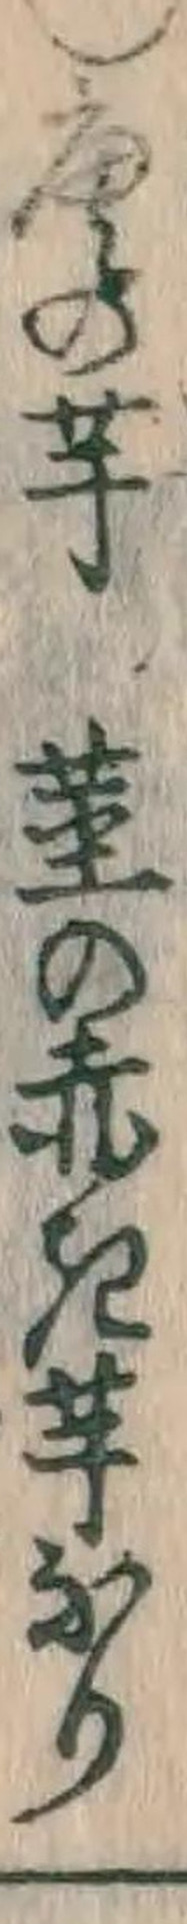○唐の芋茎の赤き芋なり
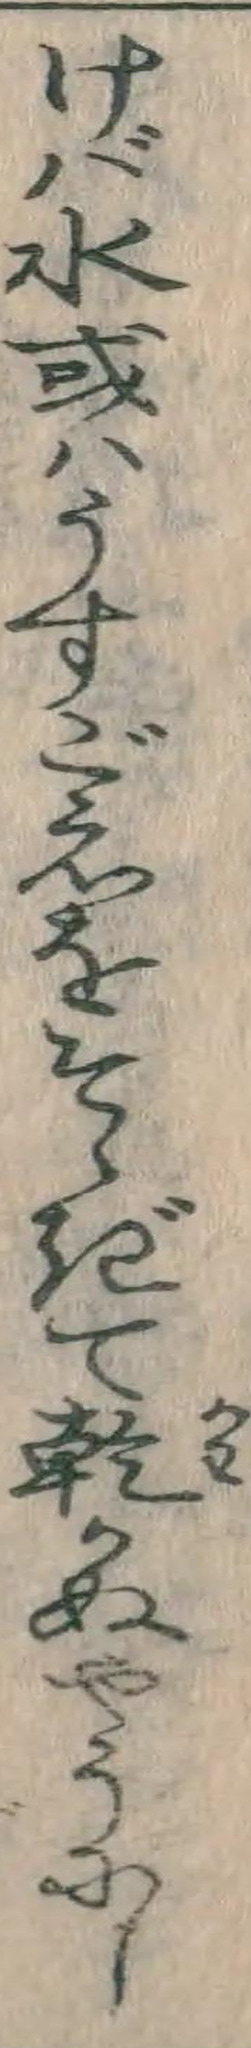けば水或はうすごえをそゝぎて乾かぬやうにし
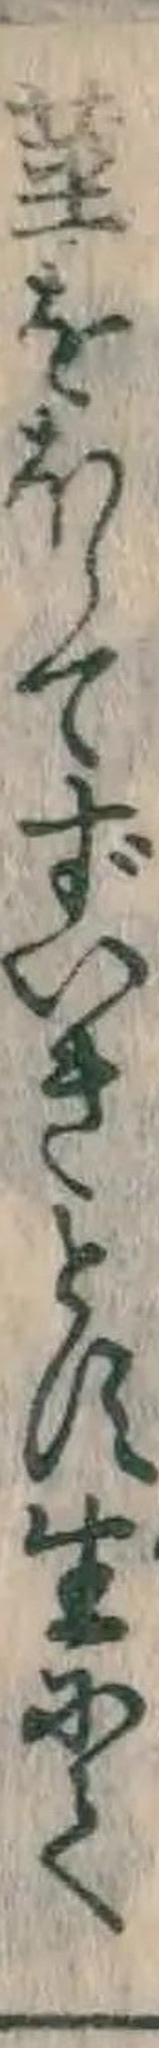茎をほしてずいきとす生にて
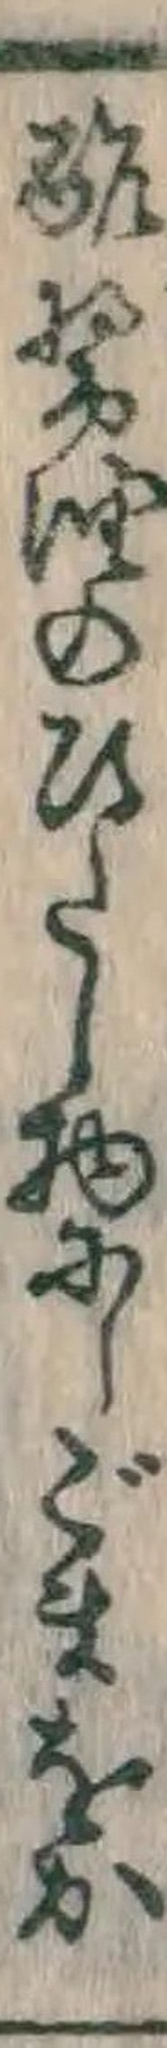酢醬油のひたし物にしごまをか
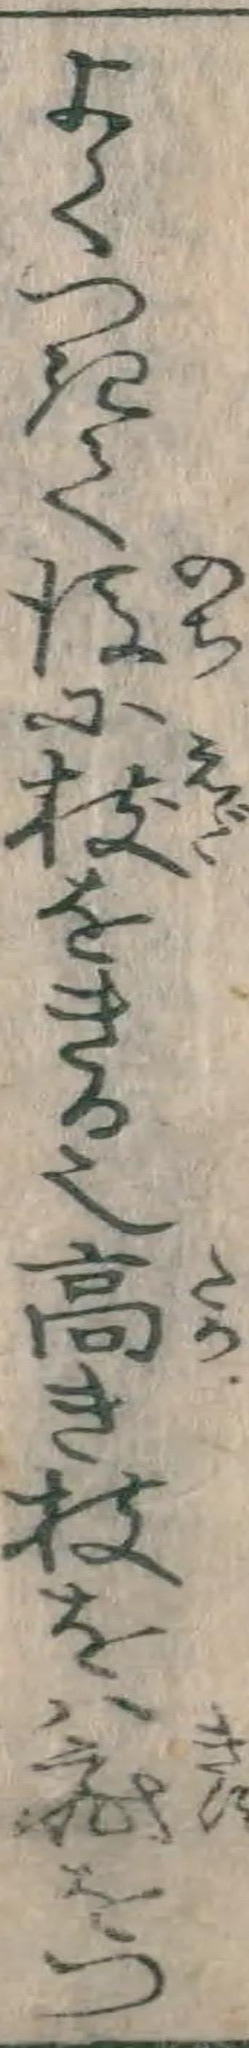よくつきて後に枝をきる也高き枝をは疵をつ
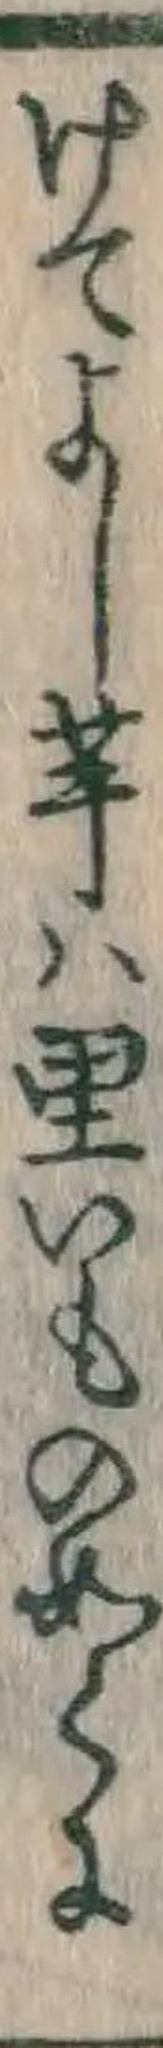けてよし芋は里いもの如くに
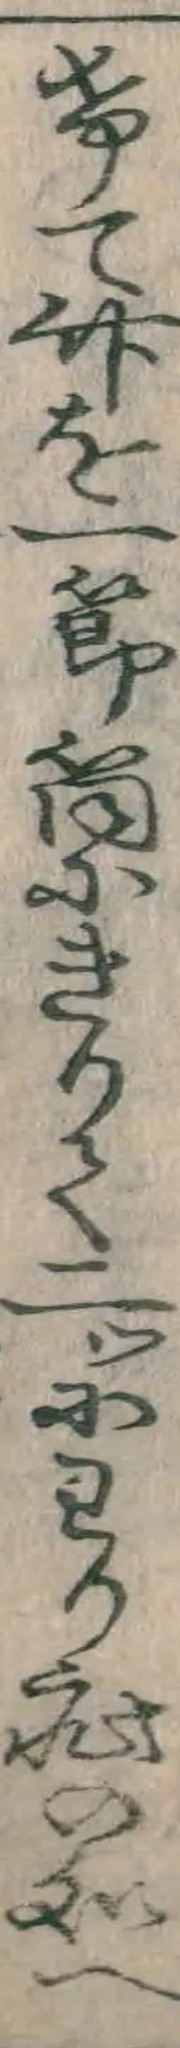けて竹を一節筒にきりて二ッにわり疵の処へ
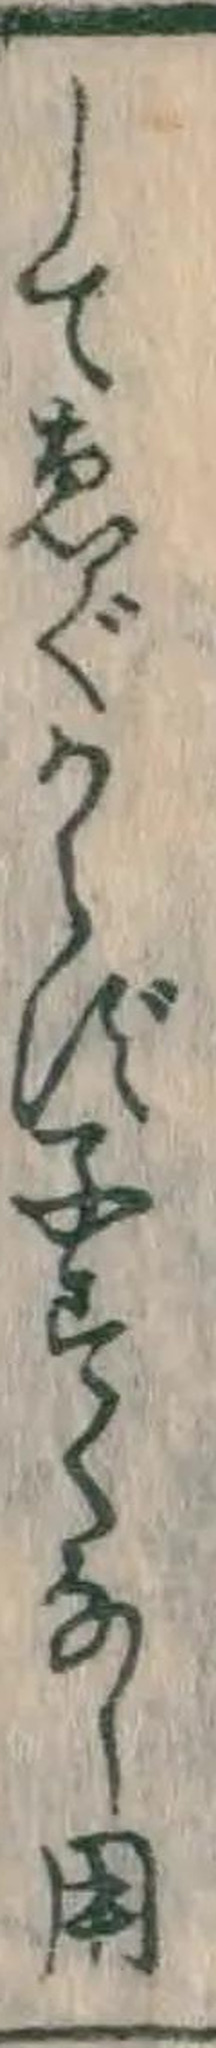してゑぐからず子すくなし用
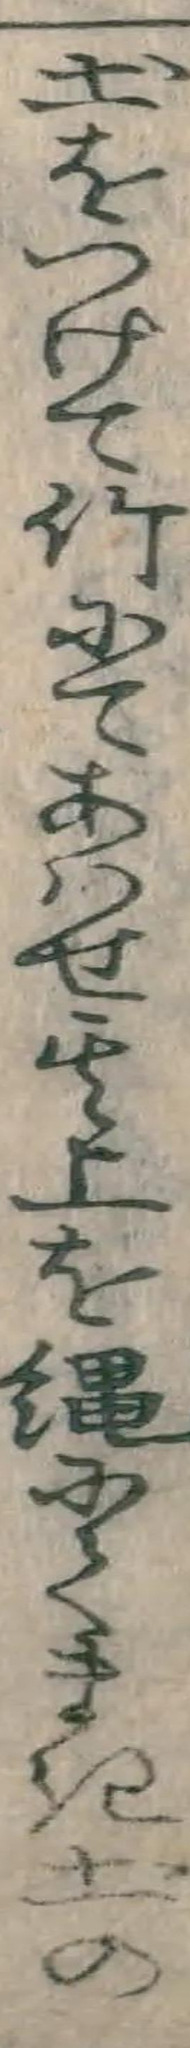土をつけて竹にてあはせ其上を縄にてまき土の
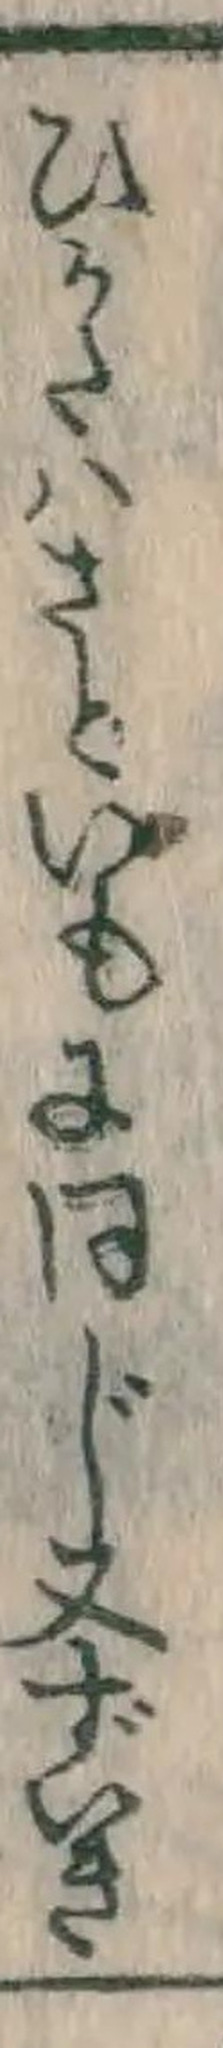ひかたはさといもに同じ又ずいき
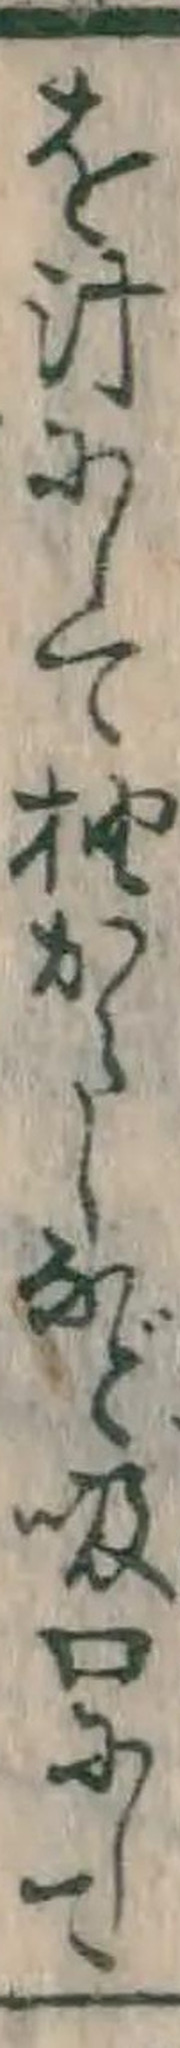を汁にして柚からしなど吸口にして
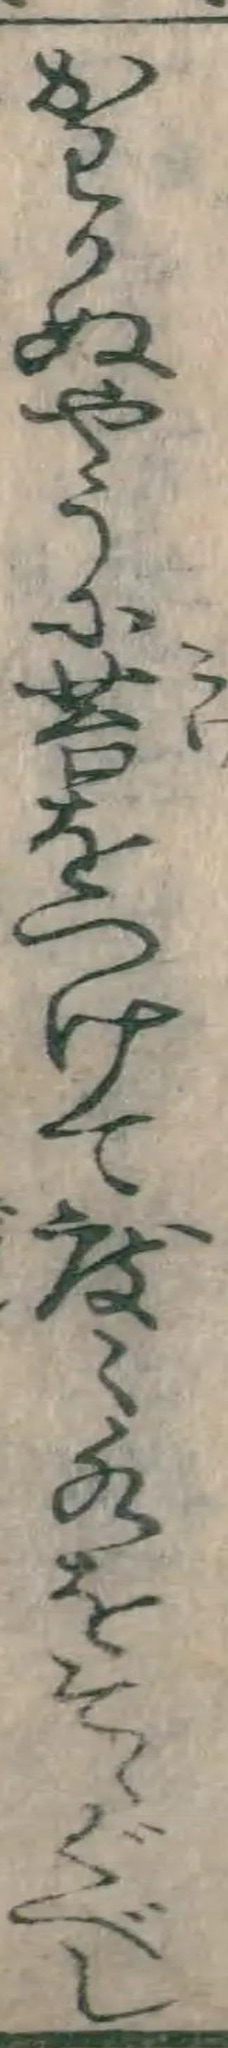かわかぬやうに苔をつけて度々水をそゝぐべし
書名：広益秘事大全 3巻. [5]
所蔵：国立国会図書館 National Diet Library, JAPAN
